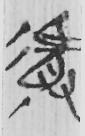虘B
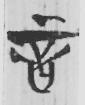言
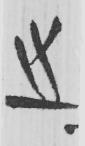之
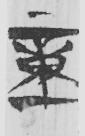童
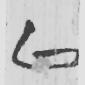㠯（以）
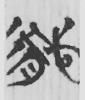{骨弋}
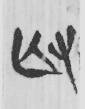{亡又}
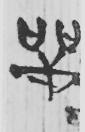咢
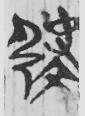{弓夬矢}
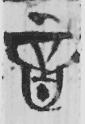音（函）
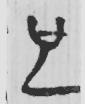也
